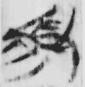須
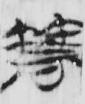箸（書）
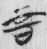言
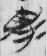{胃刀}（謂）
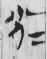於
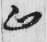㠯
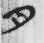月
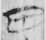甲
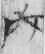戌
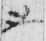之
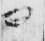日
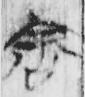舍
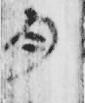肉
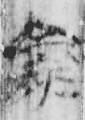彔
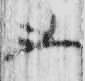之
